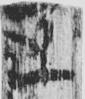是
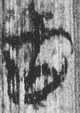古（故）
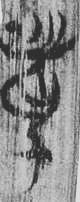○（一）
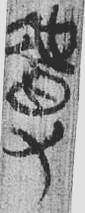○（咀）
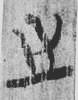之
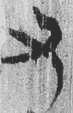又（有）
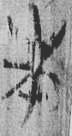未（味）
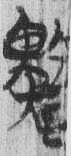{口鼻}（嗅）
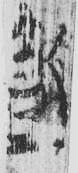鼓
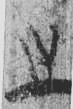之
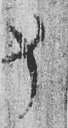又（有）
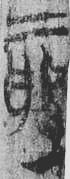聖（聲）
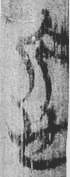忻
